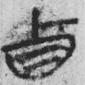貞
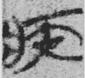疾
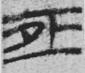○（恆）
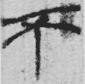不
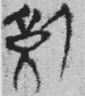死
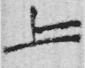上
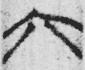六
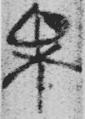杲（冥）
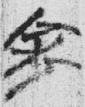○（豫）
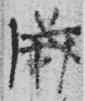成
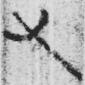又（有）
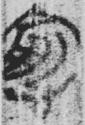愈（渝）
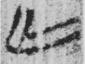亡（无）
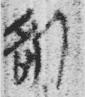咎
